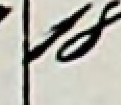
18
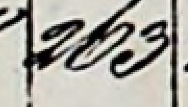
263
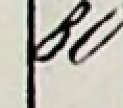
80
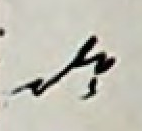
Do
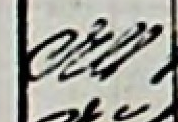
Alt
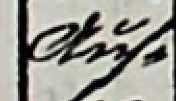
Aus„
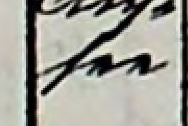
see
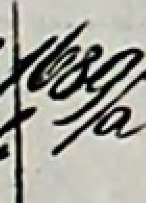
1689/a
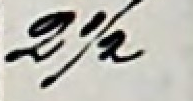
2 1/2
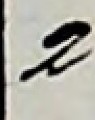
2
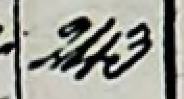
243
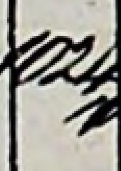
1024?
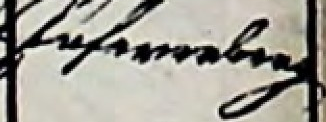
P???berg
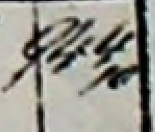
944,0
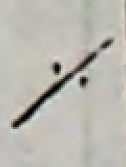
./.
